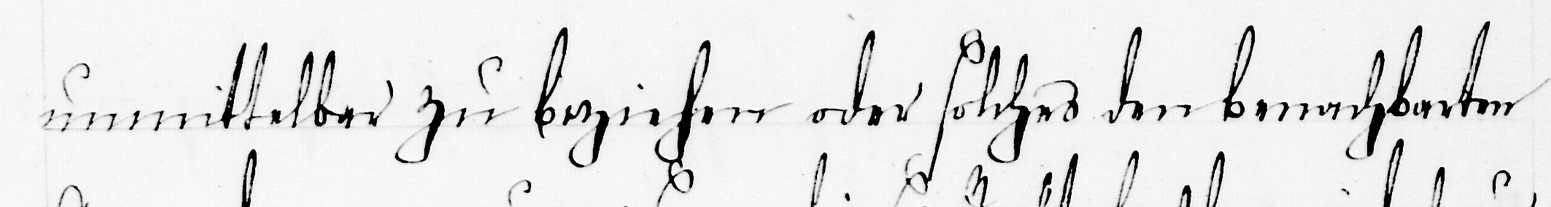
unmittelbar zu beziehen oder solches den benachbarten
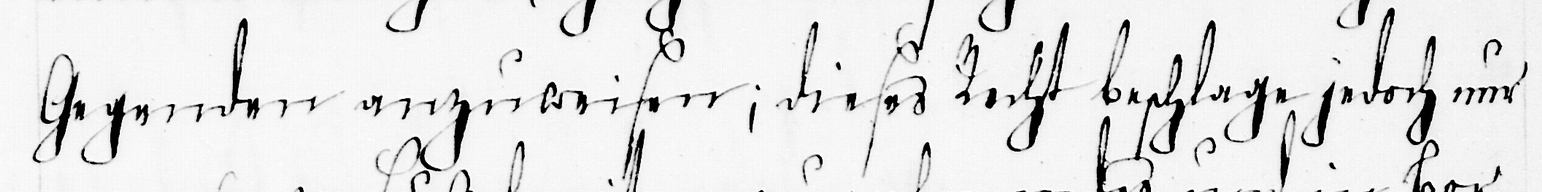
Gegenden anzuweisen; dieses Recht beschlage jedoch nur
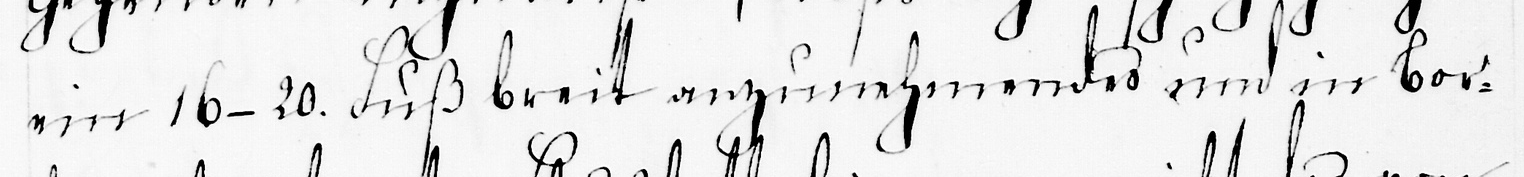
ein 16–20. Fuß breit anzunehmendes und in Bor¬
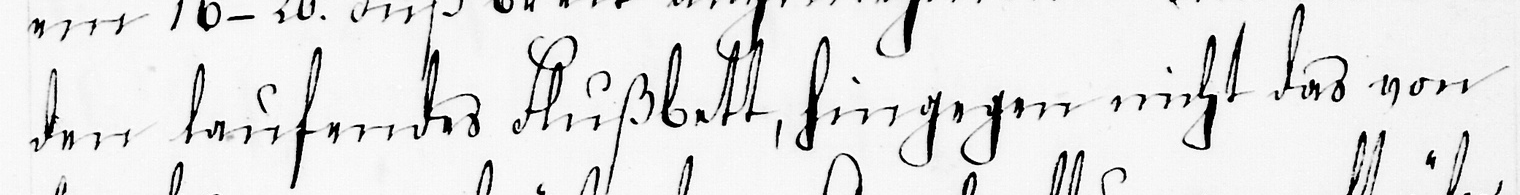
den laufendes Flußbett, hingegen nicht das von
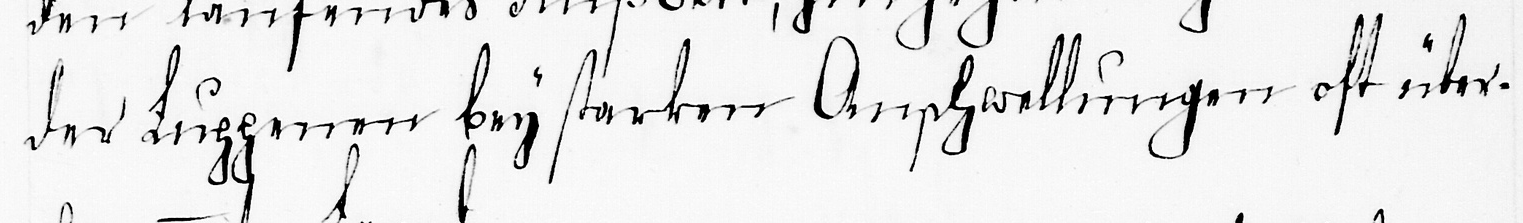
der Luppenen bey starken Anschwellungen oft über¬
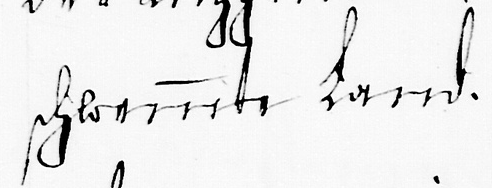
schwemmte Land.
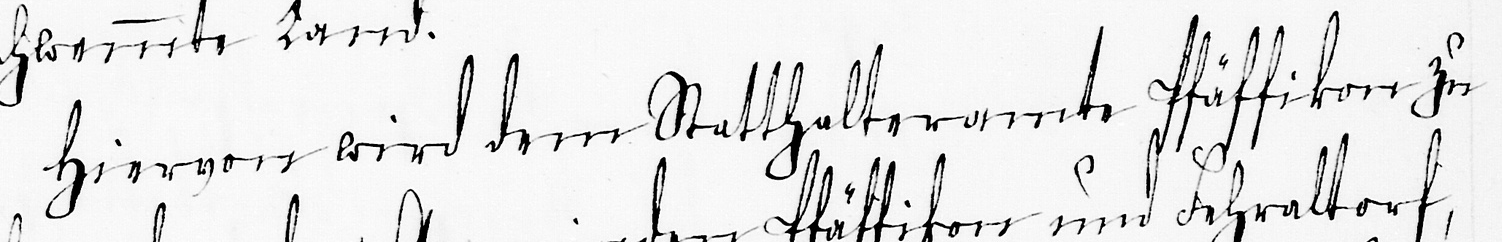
Hiervon wird dem Statthalteramte Pfäffikon zu
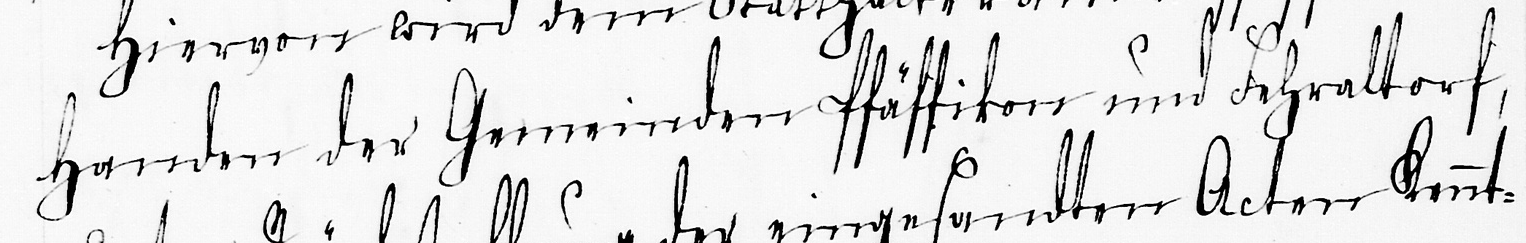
Handen der Gemeinde Pfäffikon und Fehraltorf,
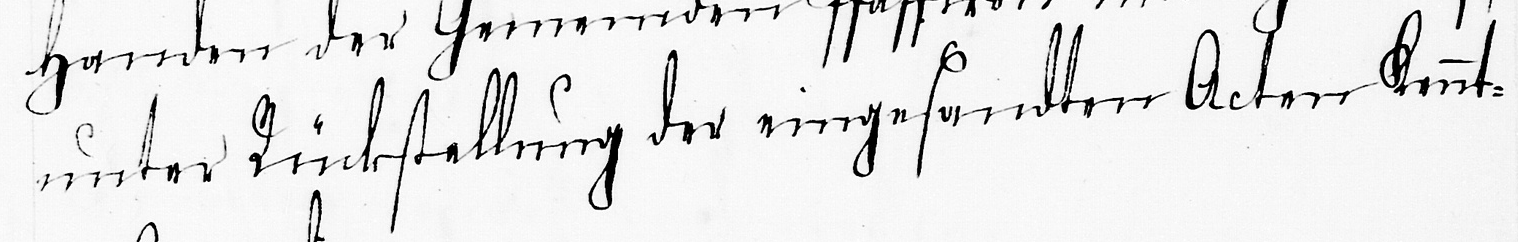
unter Rückstellung der eingesandten Acten Kennt¬
